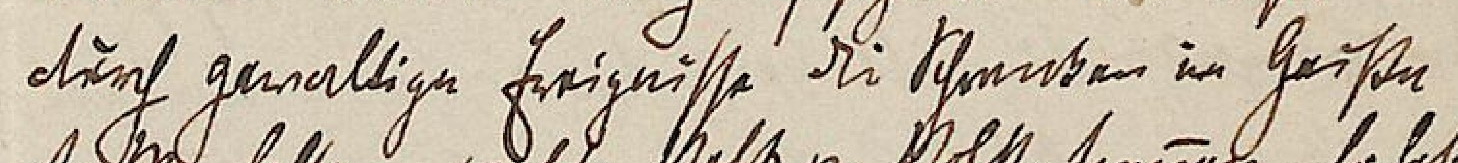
durch gewaltigen Ereigniss die Schranken im Geiste
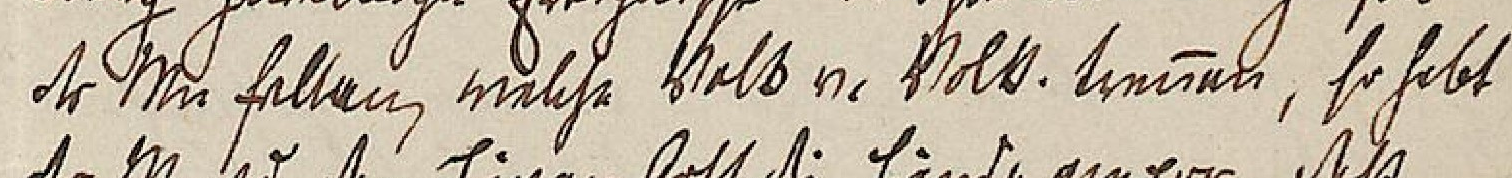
der Mn fallen, welche Volk v. Volk. trennen, so hebt
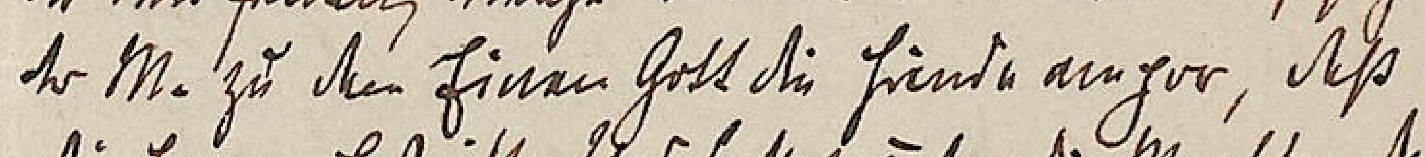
der M. zu dem Einen Gott die Hände empor, daß
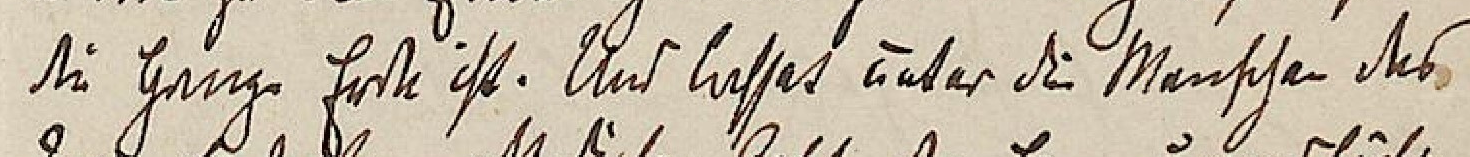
die Ganze Erde ist. Und lasset unter die Menschen das
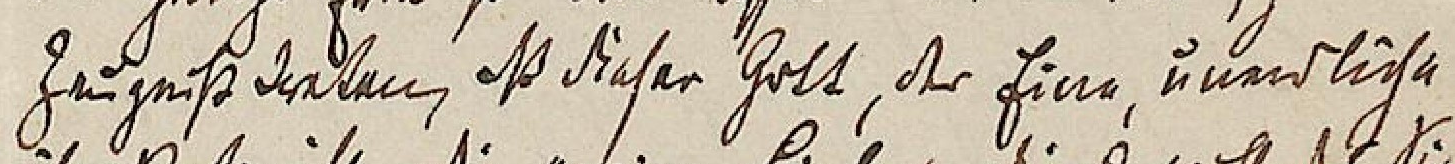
Zeugnis treten, daß dieser Gott, der Eine, unendliche
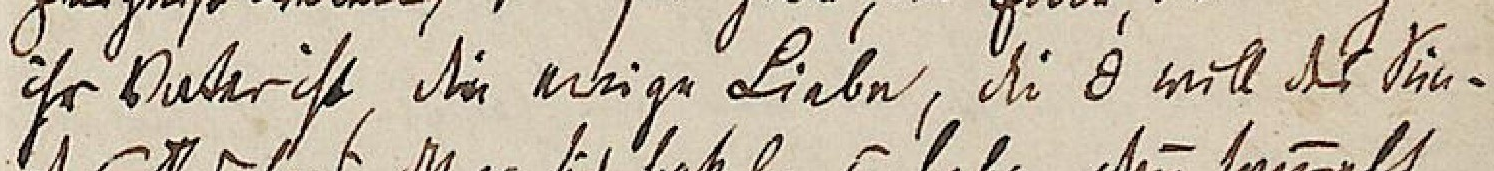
ihr Vater ist, die ewige Liebe, die o will des Sün¬
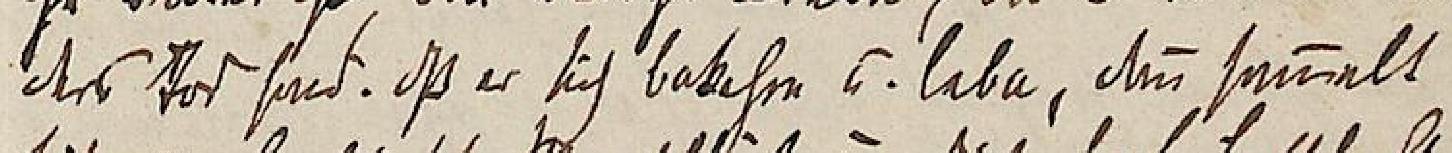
ders Tod, sond. daß er sich bekehre u. lebe, dann sammelt
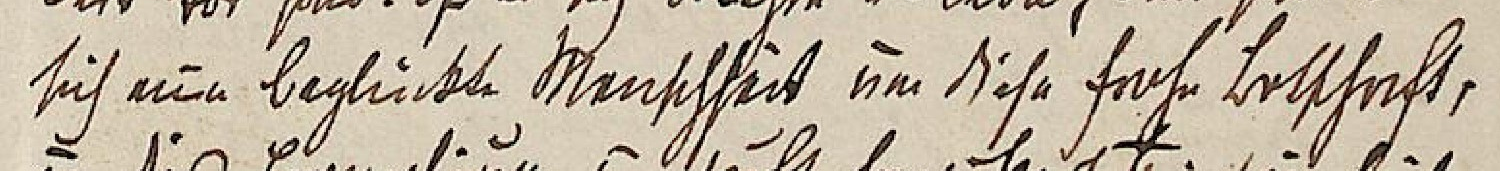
sich eine beglückte Menschheit um diese frohe Botschaft,
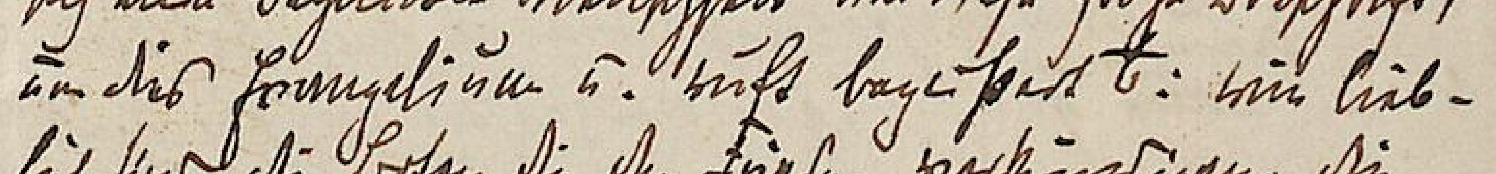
um dies Evangelium u. ruft begeistert s: wie lieb¬
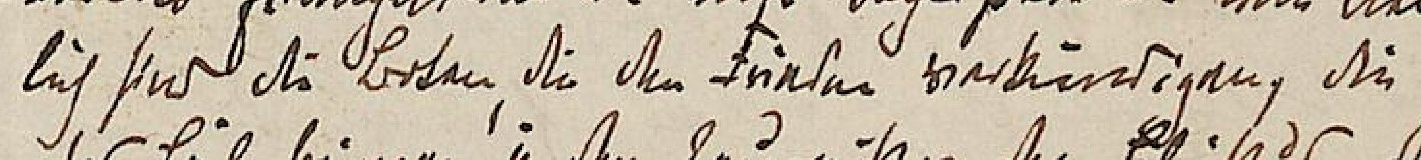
lich sind die Boten, die den Frieden verkündigen, die
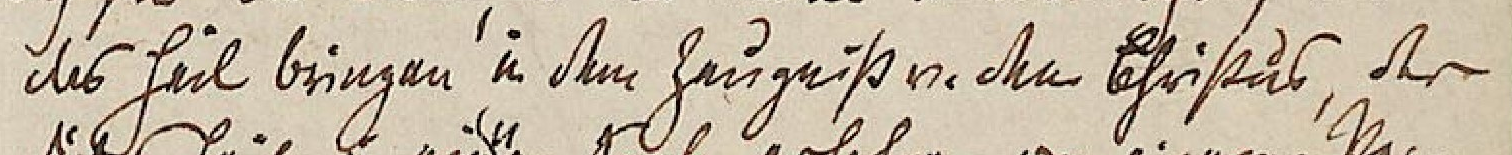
das Heil bringen in dem Zeugniß v. dem Christus, der
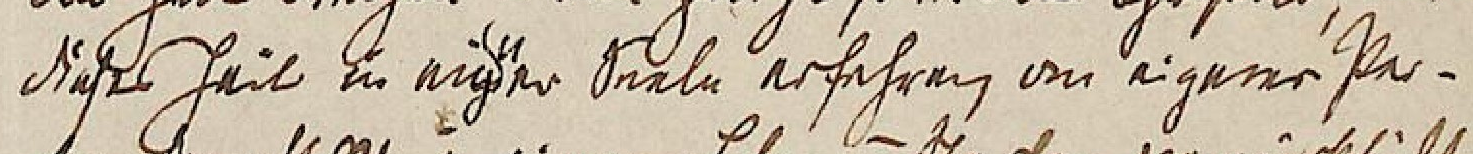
dieses Heil in einer Seele erfahren, an eigener Per¬
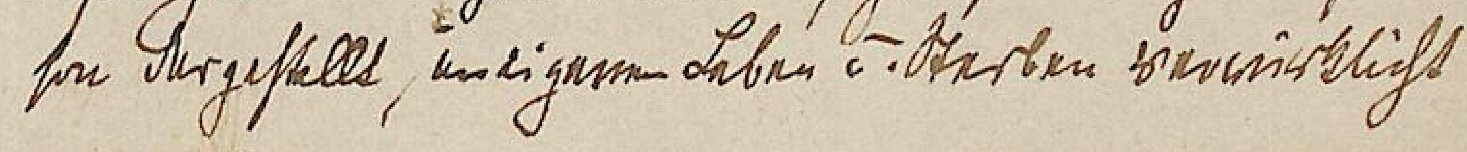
son dargestellt, irdigem Leben u. Sterben verwirklicht
